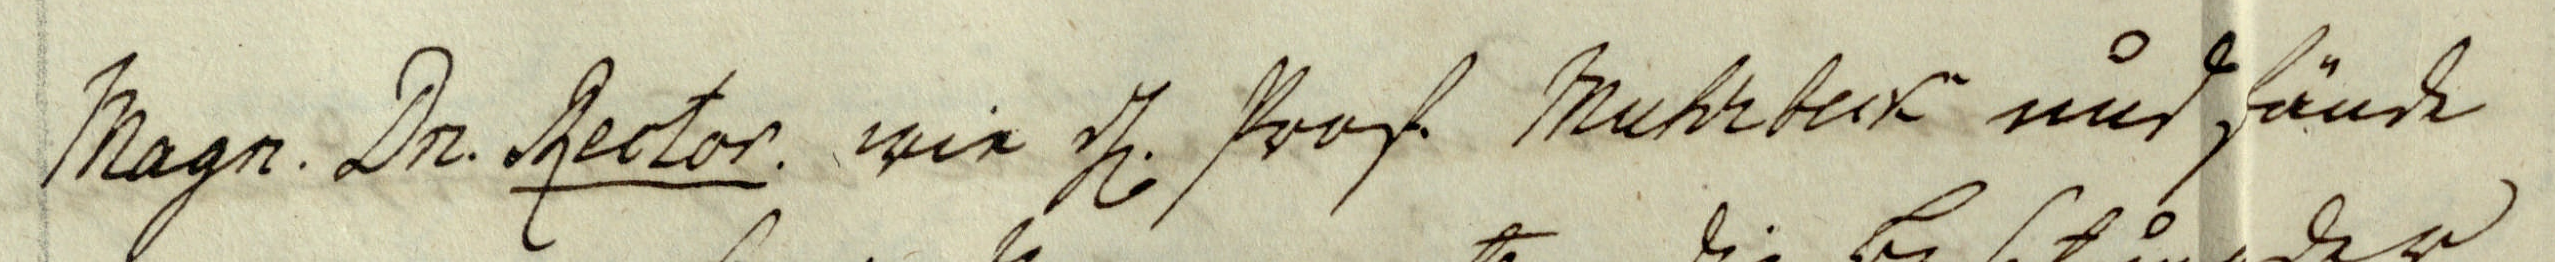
Magn. Dn. Rector. wie dh. Prof. Muhrbeck und fände
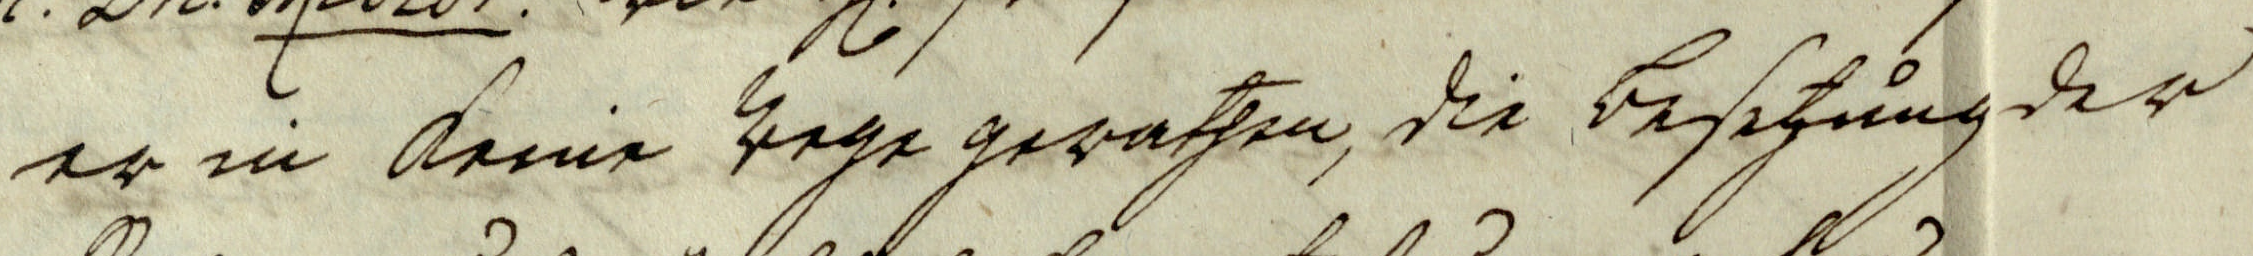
er in keine Wege gerathen, die Besetzung der
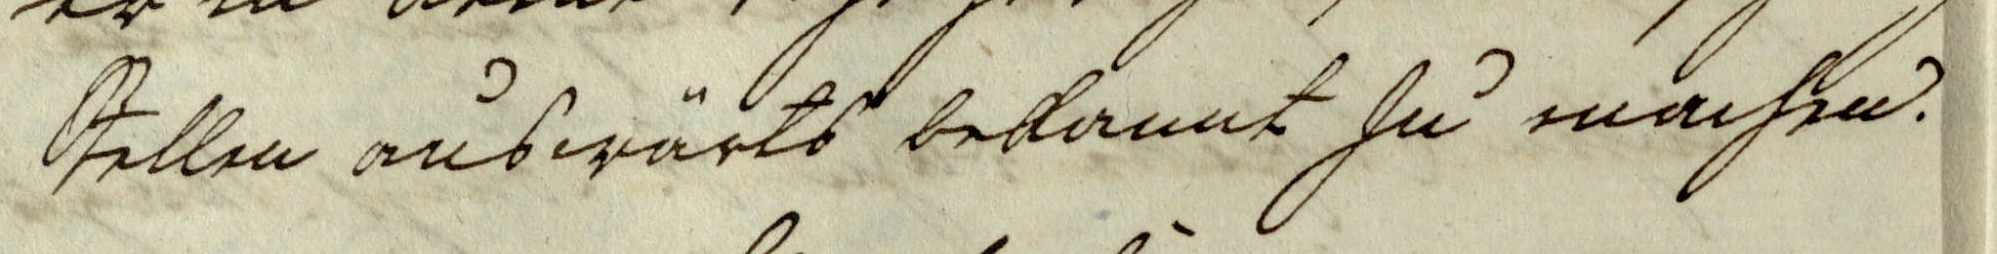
Stellen auswärts bekannt zu machen.
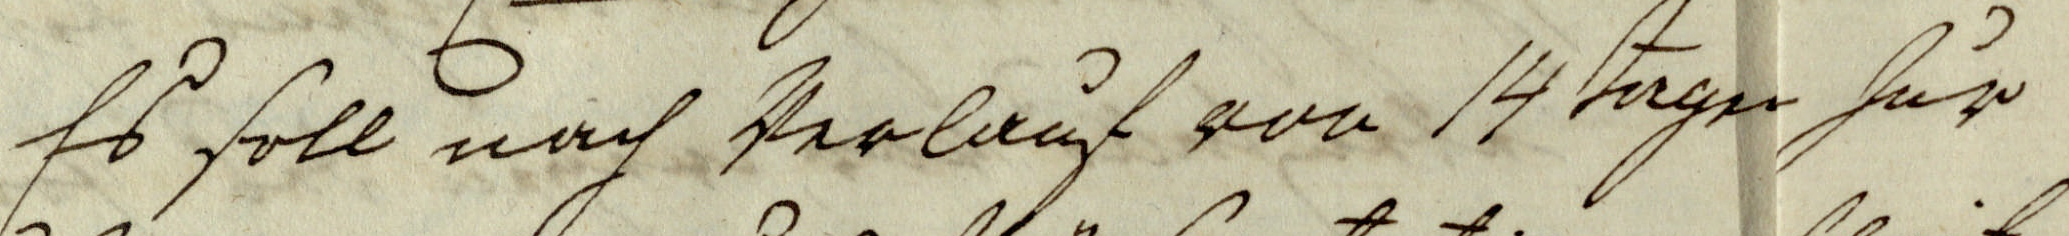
Es soll nach Verlauf von 14 Tagen zur
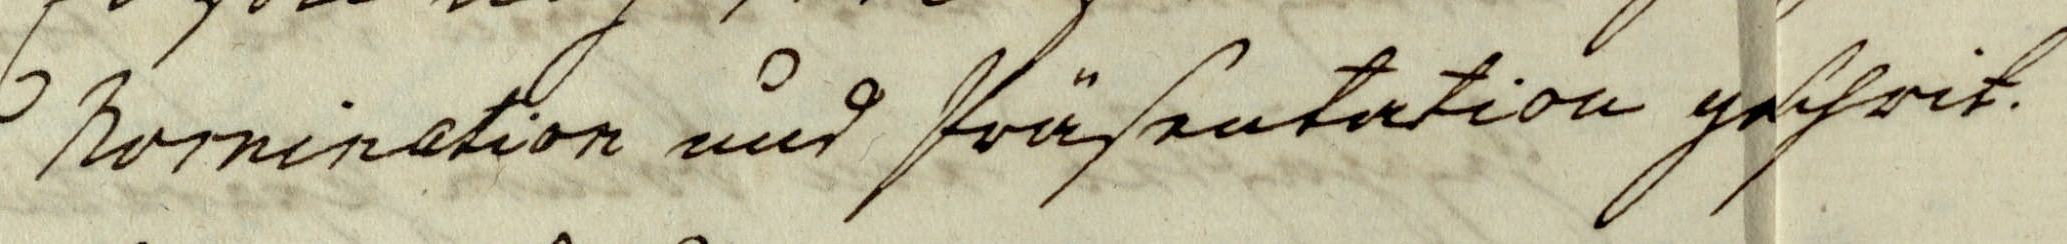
Nomination und Präsentation geschrit¬
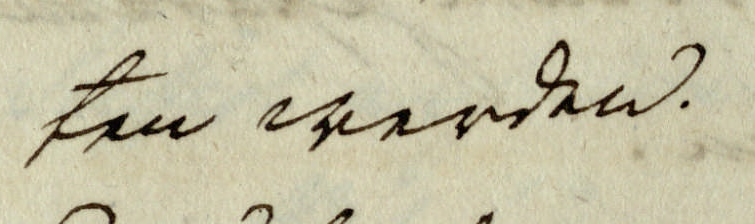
ten werden.
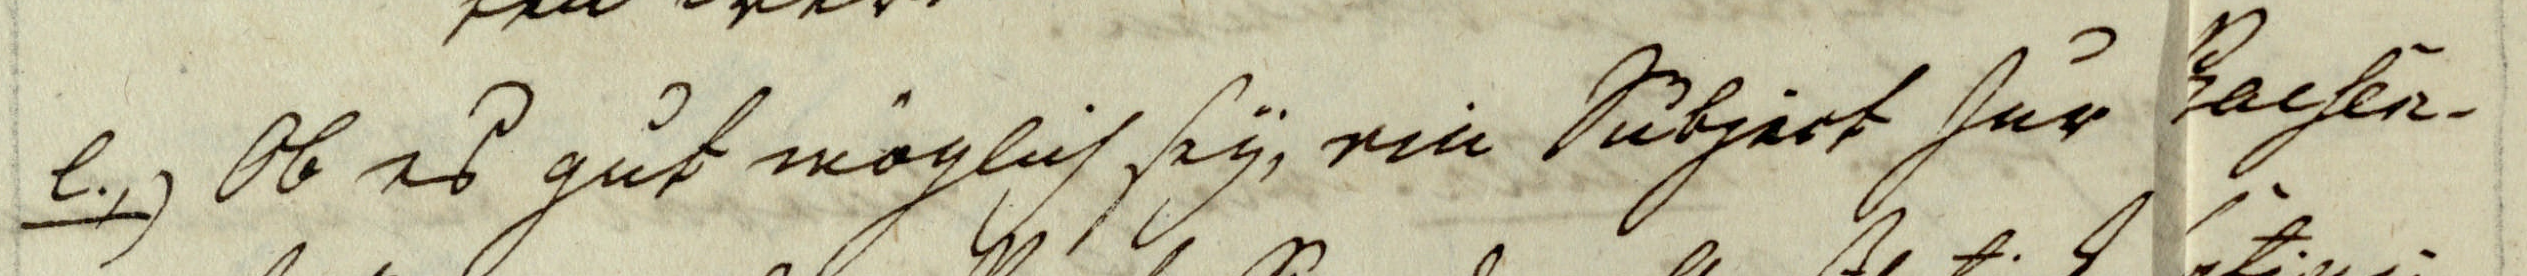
e.,) Ob es gut möglich seÿ, ein Subject zur Praesen¬
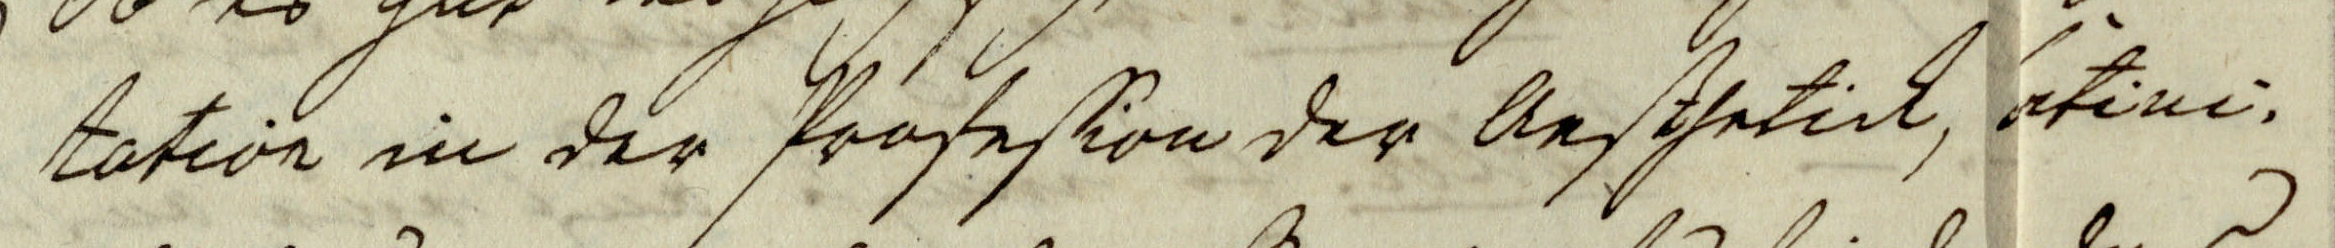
tation in der Profession der Aesthetick, Latini¬
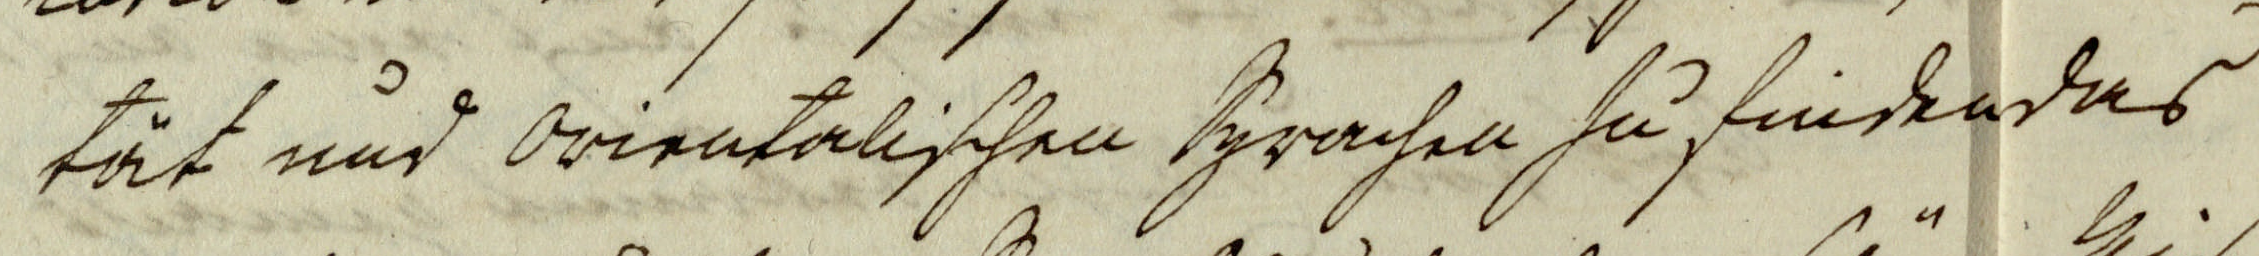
tät und Orientalischen Sprachen zu finden das
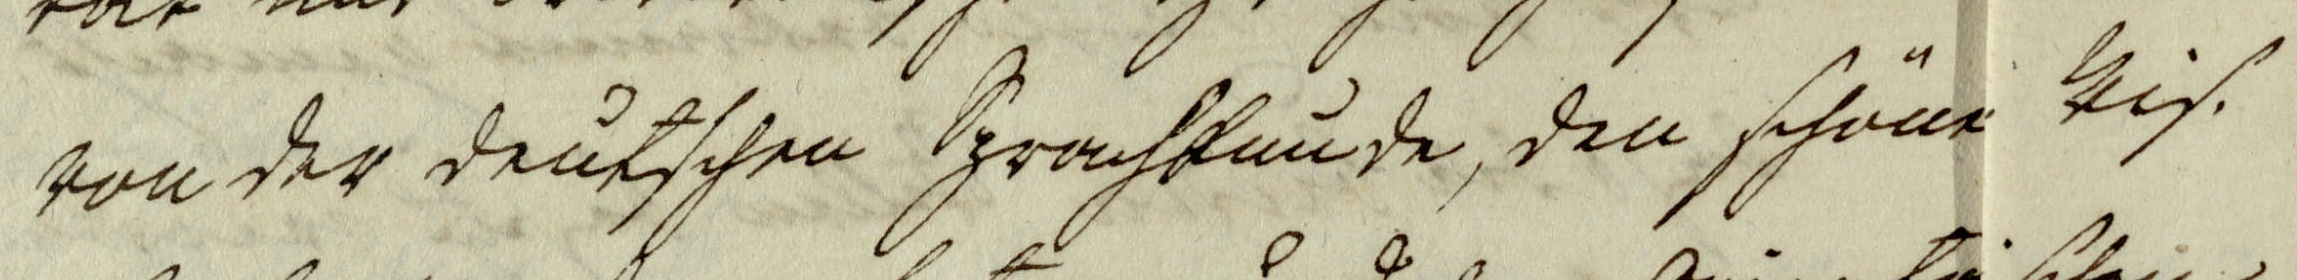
von der deutschen Sprachkunde, den schönen Wis¬
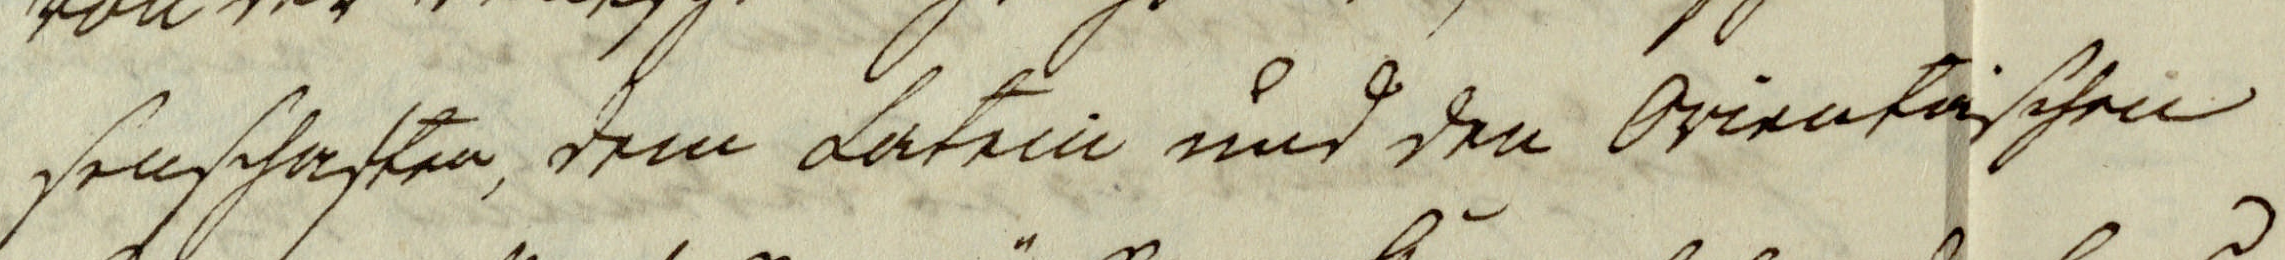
senschaften, dem Latein und den Orientalischen
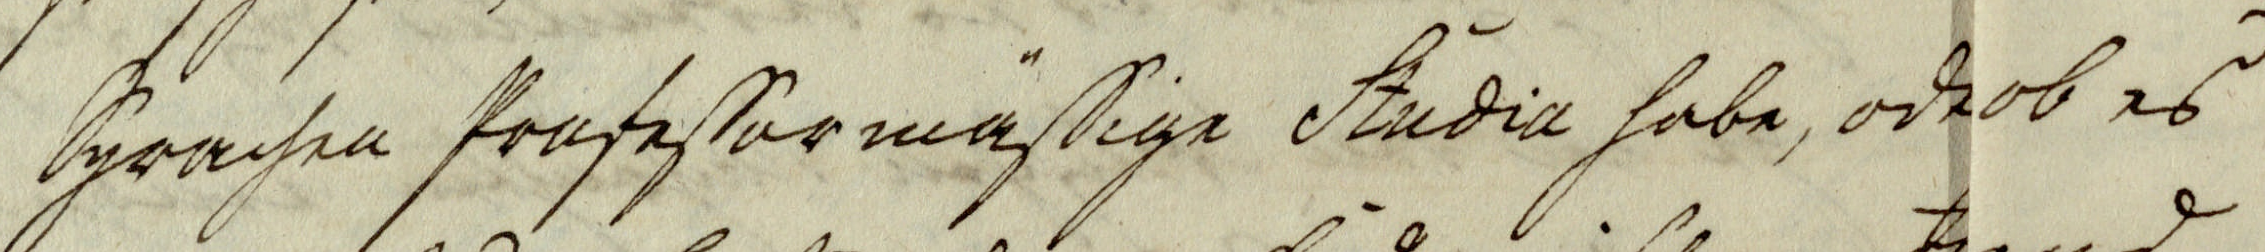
Sprachen Professor mässige Studia habe, oder ob es
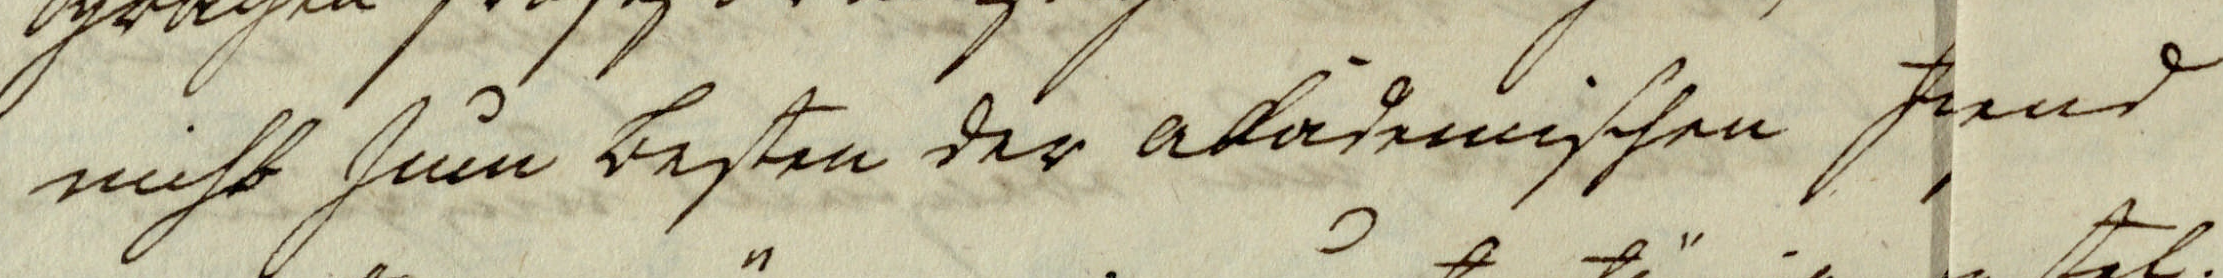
nicht zum Besten der akademischen xxx
